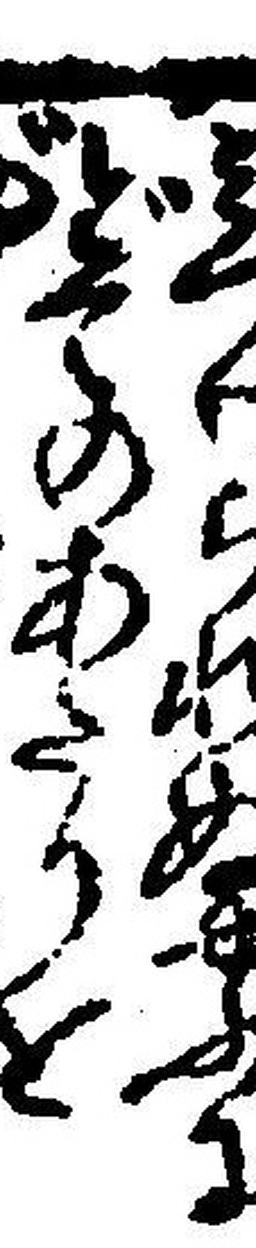どてのあたりを
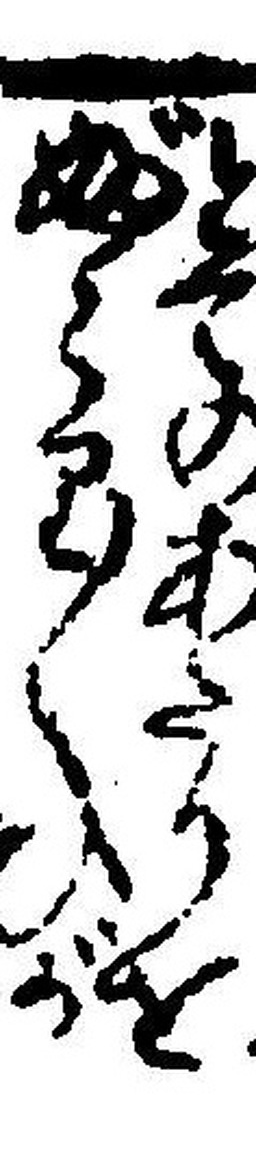ぶらり〳〵ひが
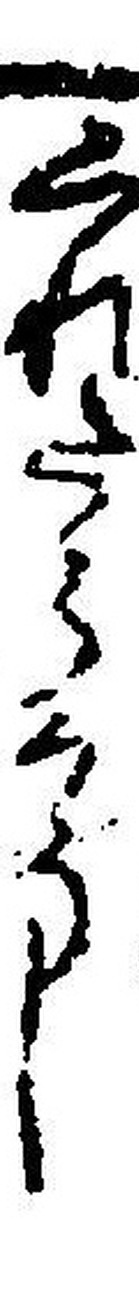くれたらかうし
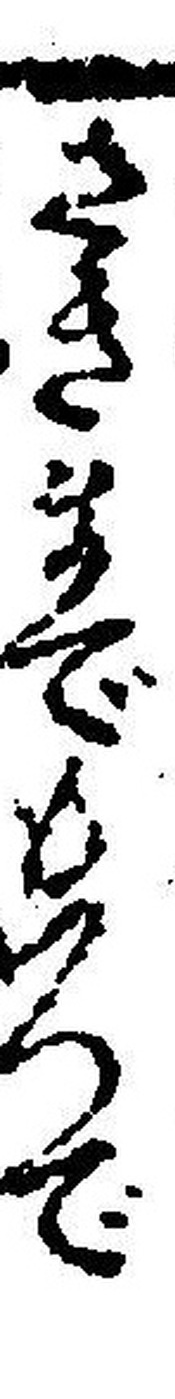さきまでもいつて
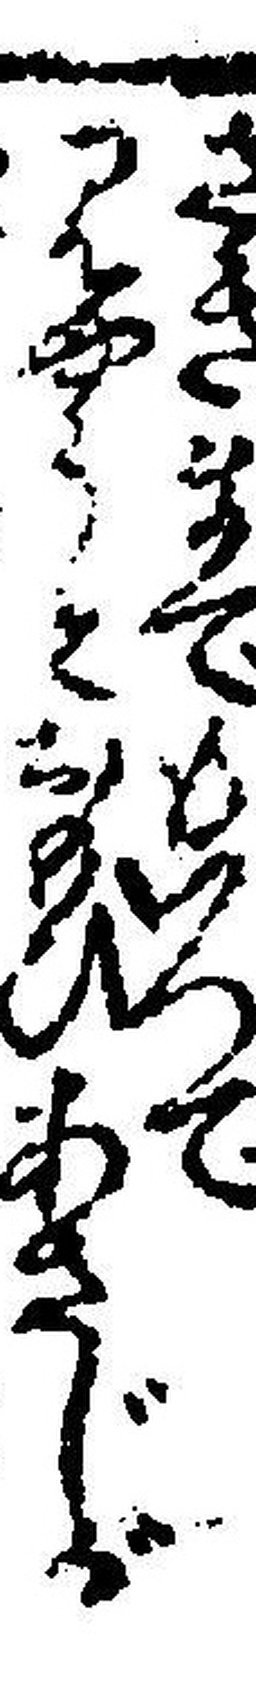みやうとおもひあさじが
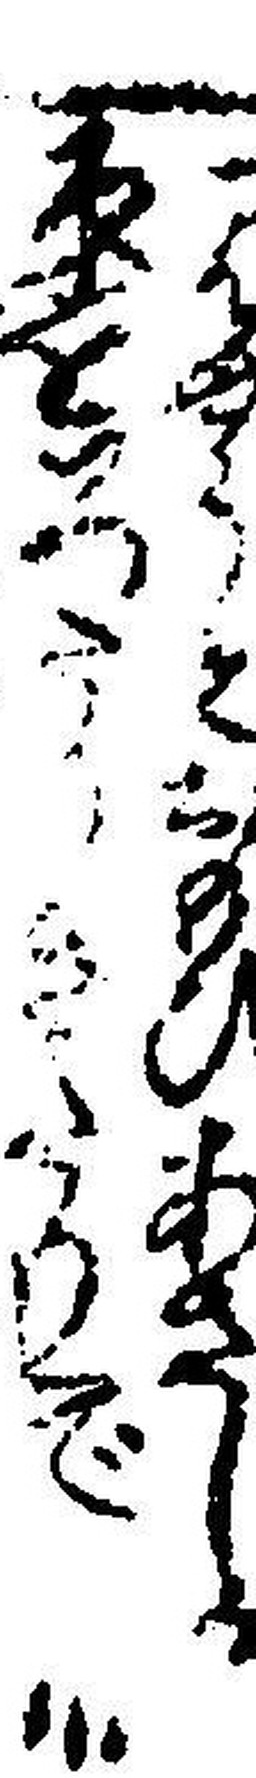原をいつたりきたりで
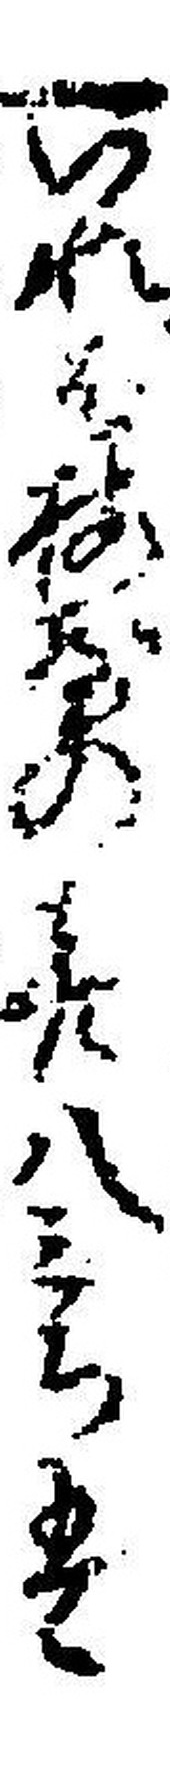いれは梅屋の喜八みちにて
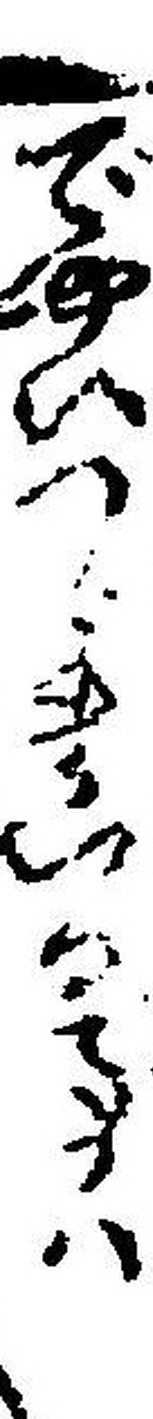でやいつかまいる事は
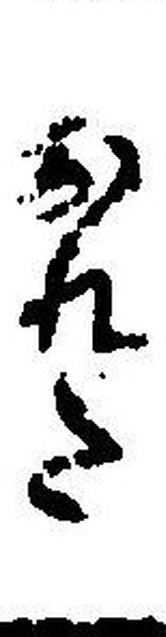おれた
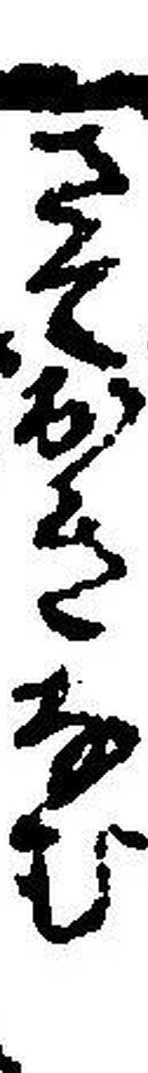さておきなむ
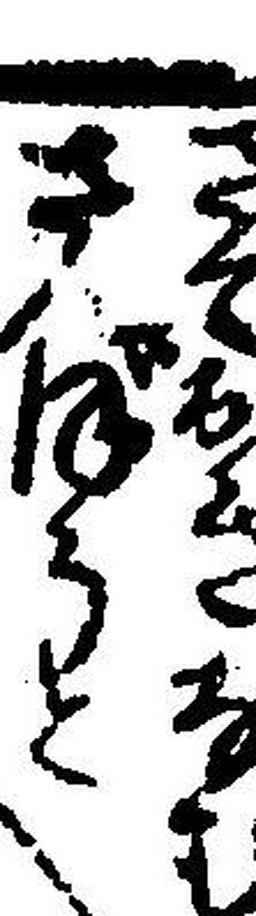さんぼうと
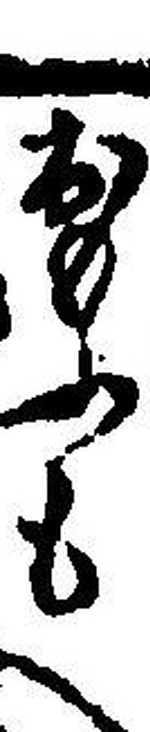おもふも
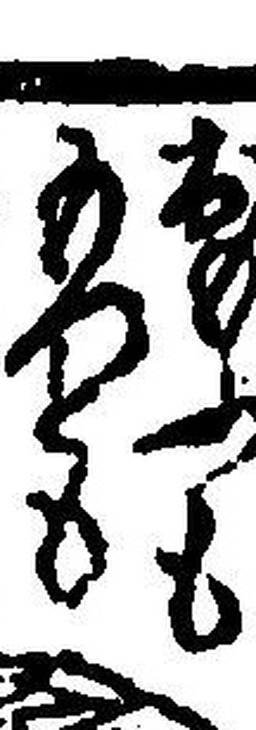もつとも
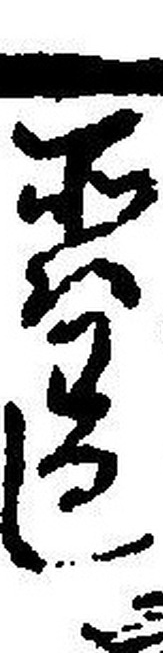所はわるし
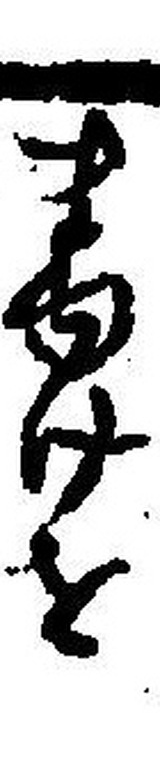まゆけを
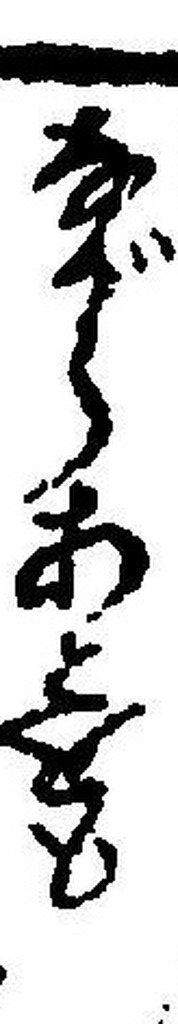ながらあとをも
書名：間違狐之女郎買 / 市場通笑作
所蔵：東京大学総合図書館 General Library in the University of Tokyo, JAPAN
